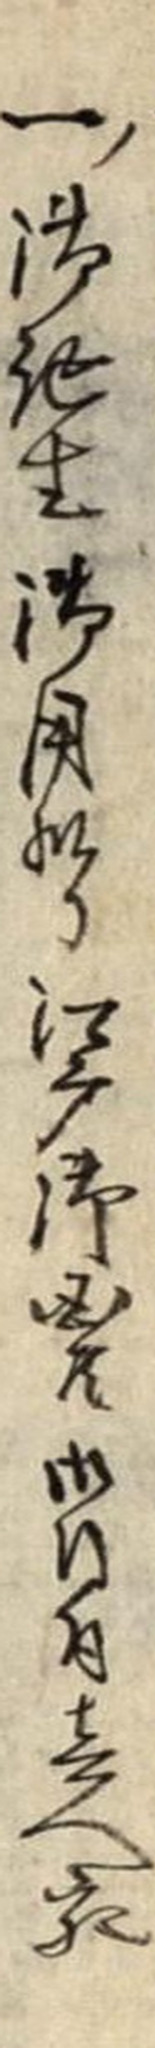一御誕生御用掛り江戸御国共御目付壱人宛
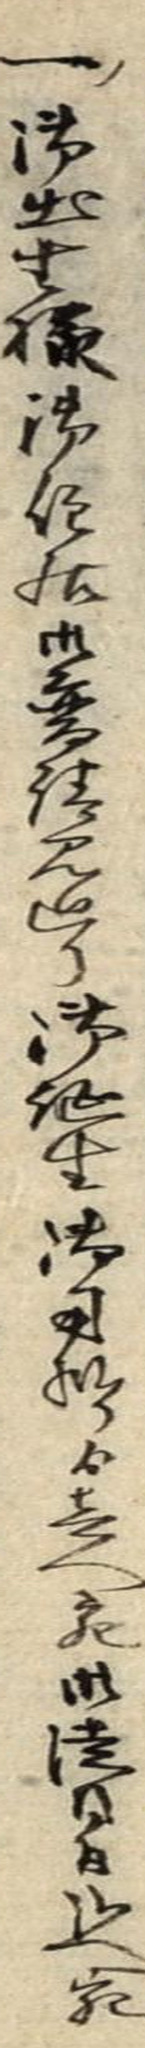一御出生様御住居御普請見廻り御誕生御用掛りゟ壱人宛御徒目付弐人宛
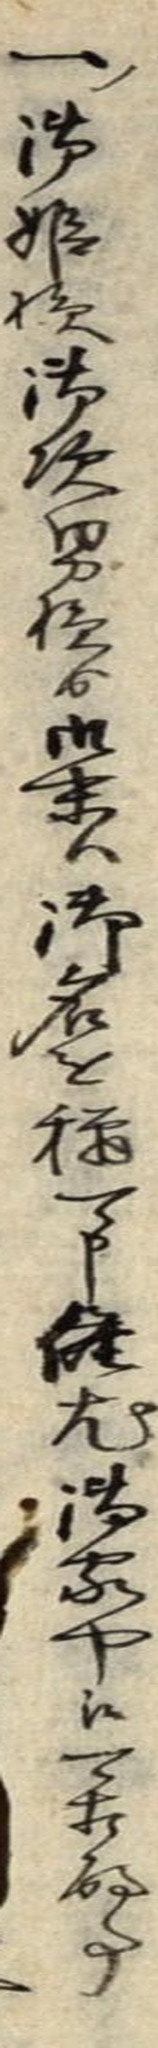一御姫様御次男様ゟ御末は御名を称可申候尤御家中江可相触事
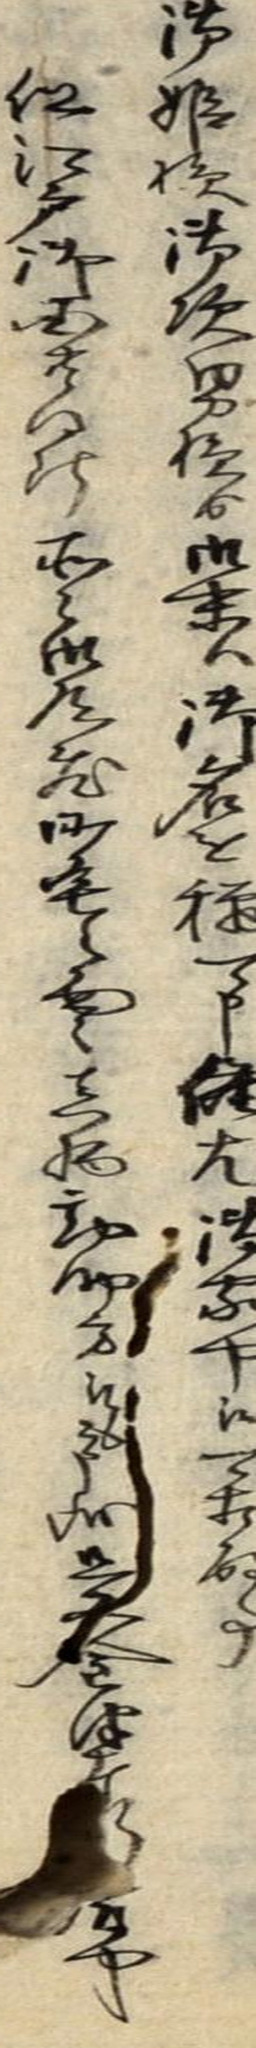但江戸御国共同断所々御屋敷御宅之面々真柄勘助方江も被申越且又金津奉行付中
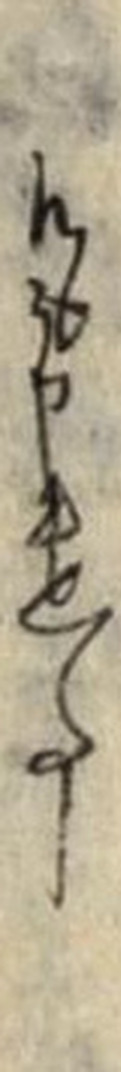江も申遣事
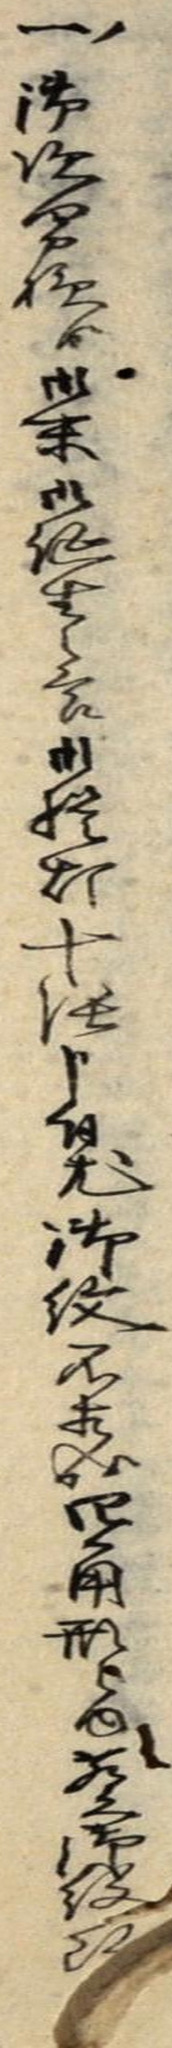一御次男様ゟ御末御誕生之節御提灯十張申付尤御紋不相成四角形之内葵御紋

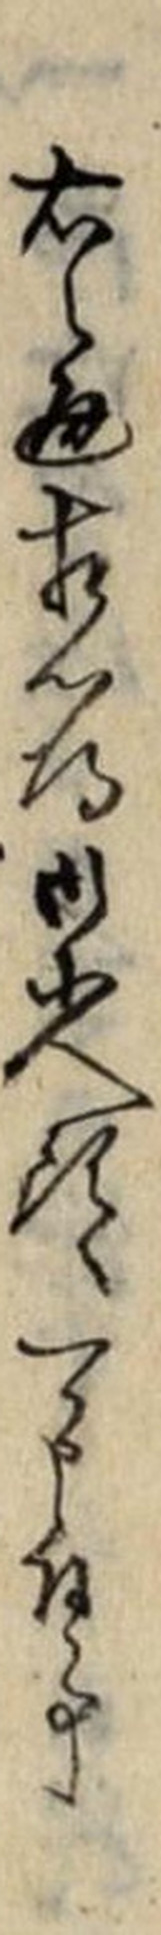右之通相心得御小人頭へ可申付事
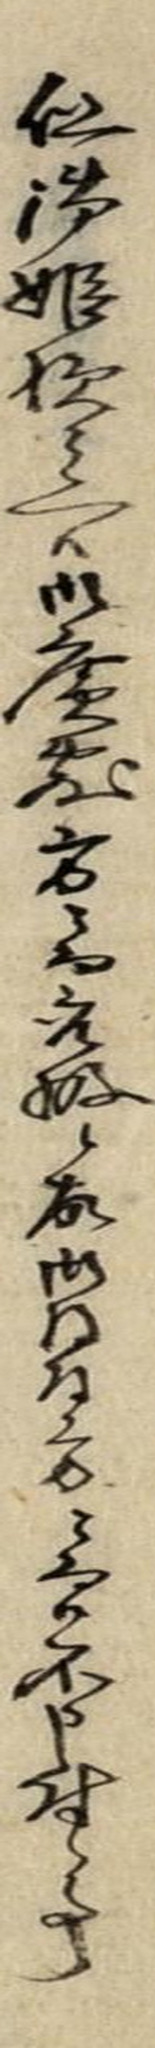但御姫様に候へは御広敷方にて取扱候故御目付方にては不申付候事
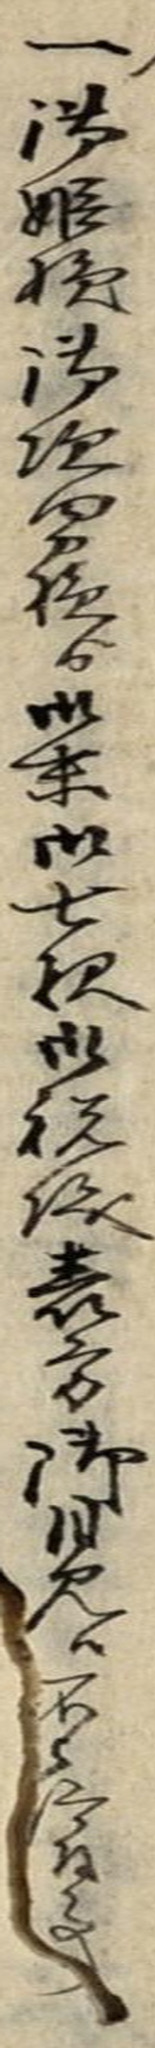一御姫様御次男様ゟ御末御七夜御祝儀表方御目見は不被仰付事
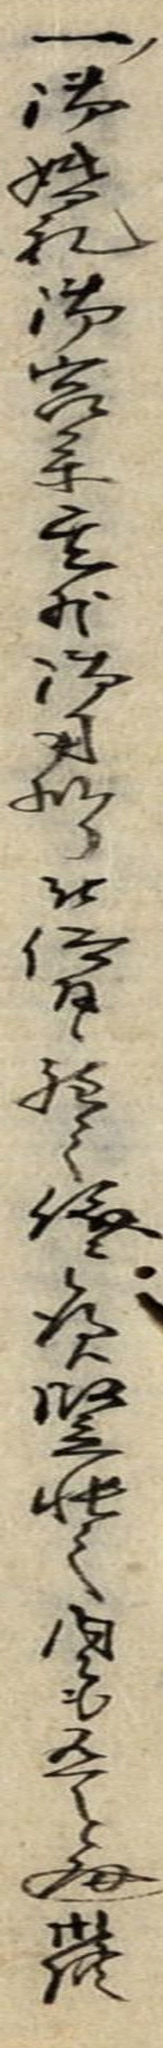一御婚礼御宮参其外御用掛り被仰付候程之儀に候得は竪帳之内にも有之通御供
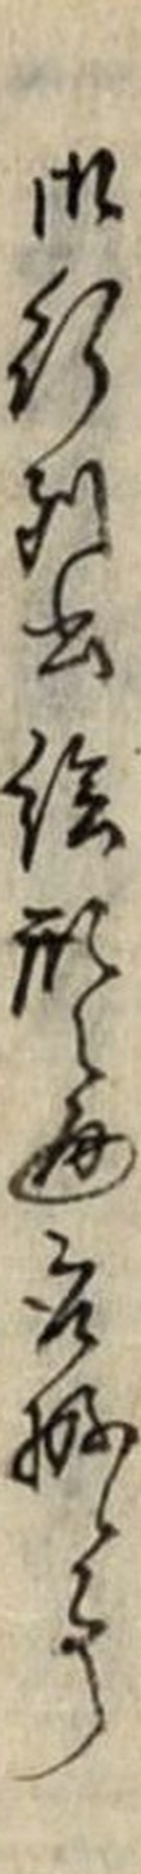御行列書絵形之通取扱候事
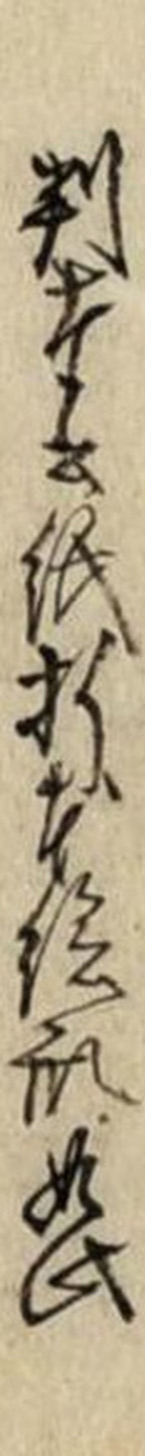判奉書紙折本絵形如此
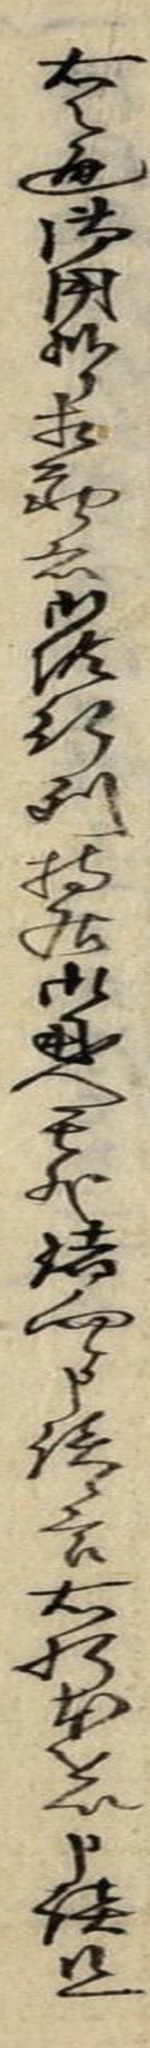右之通御用掛り相勤候者御供行列持居御用人其外諸向へ申談候節右折本を以申談且
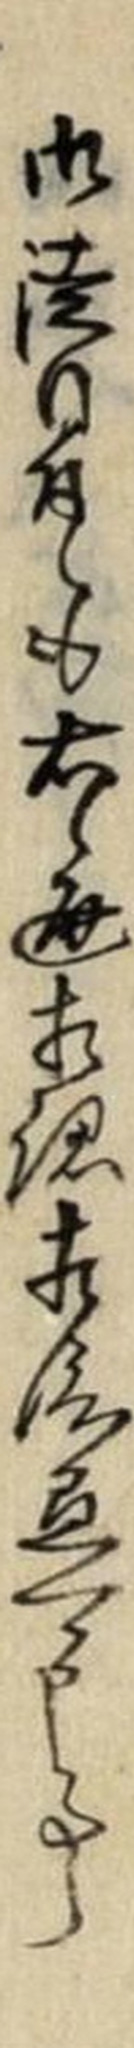御徒目付へも右之通相認相渡置可申事
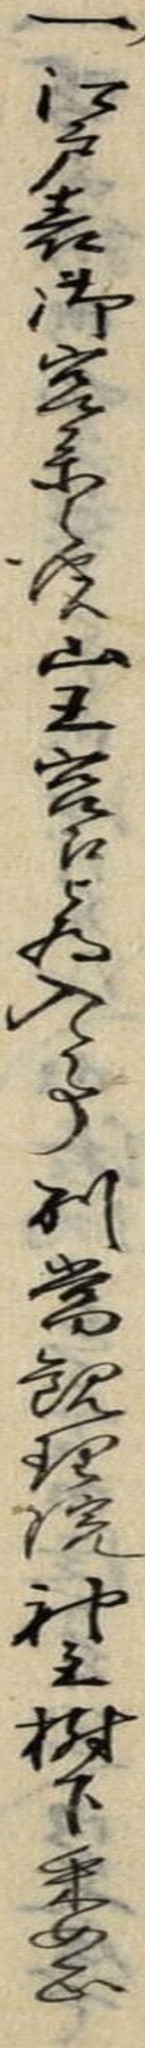一江戸表御宮参之儀は山王宮江被為入候事別当観理院神主樹下采女正
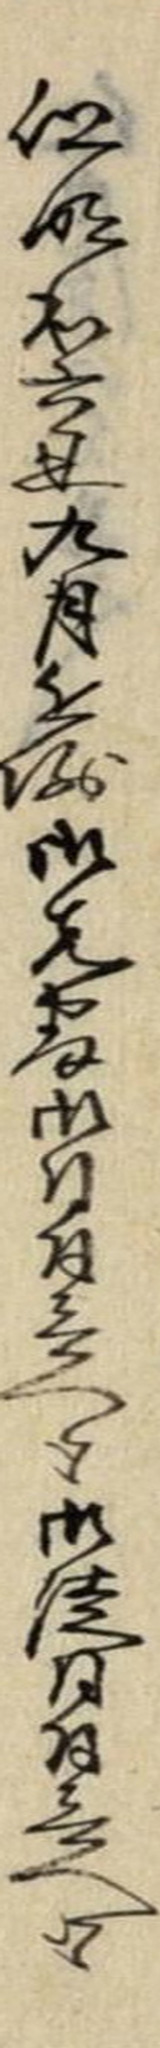但明和六丑九月近例御先番御目付壱人ツヽ御徒目付壱人ツヽ
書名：三都并道中之部
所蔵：福井県文書館 Fukui Prefectural Archives
